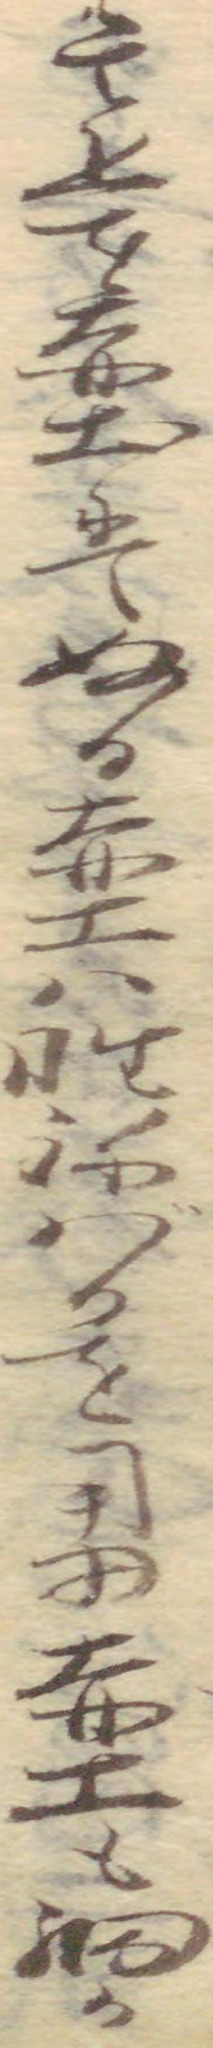其上を赤土にてぬる赤土ハ性ねバりを用ゆ赤土も細か
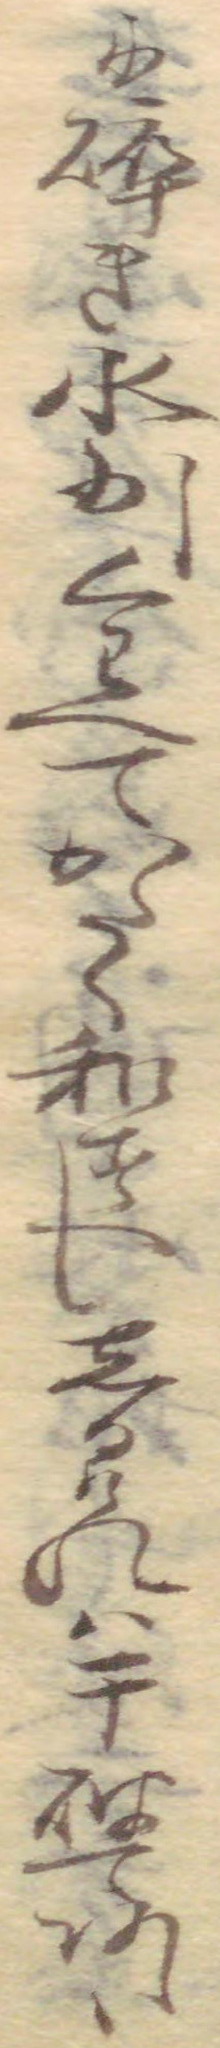に砕き水少しくわへてかたく和すへししるけれハ干破てあし也

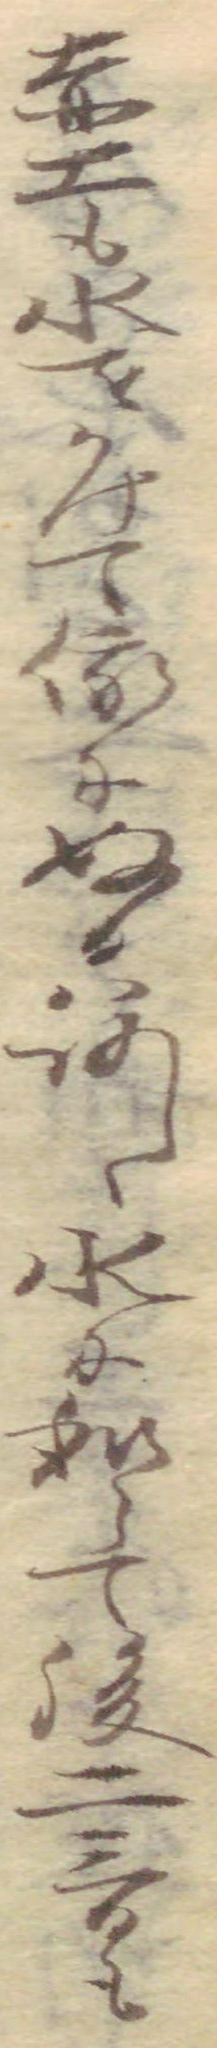赤土も水をかけて俄にぬるハあし也水に和して後二三日も
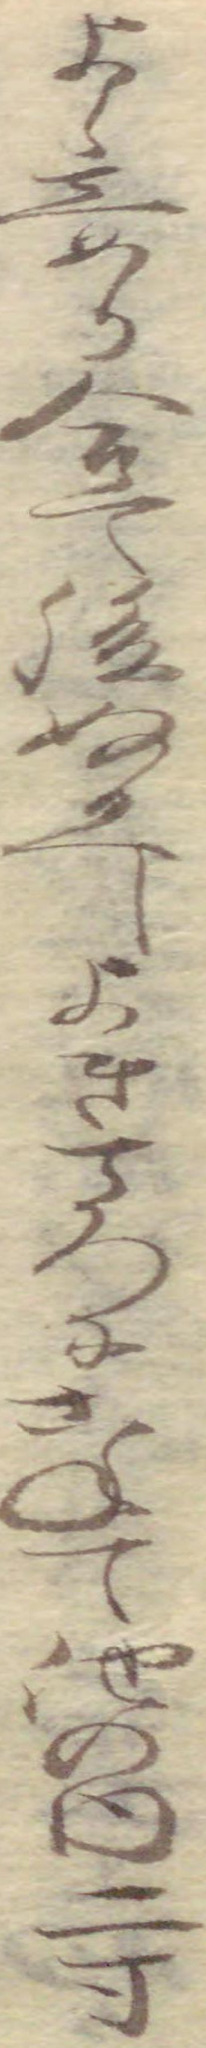よくしめり合て後ぬるへしよきころにこねて池の内二寸
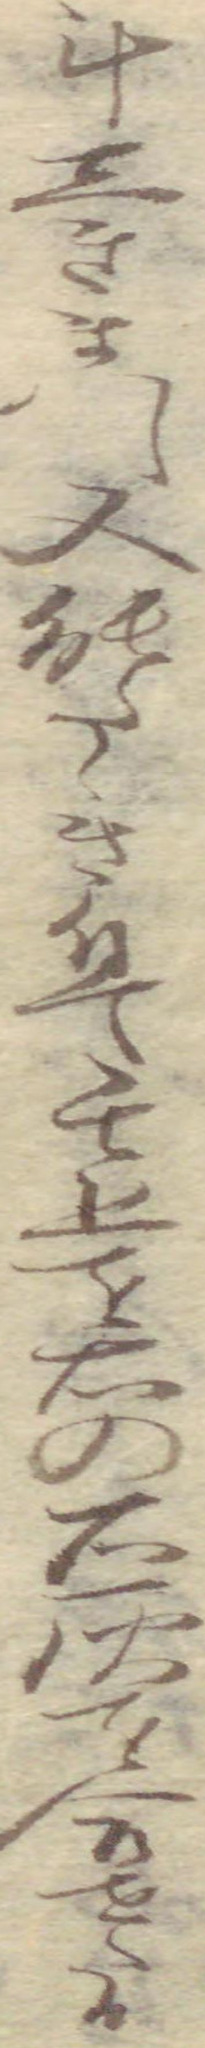斗しきまハし又能たゝき付て其上を右の石灰を合せたる
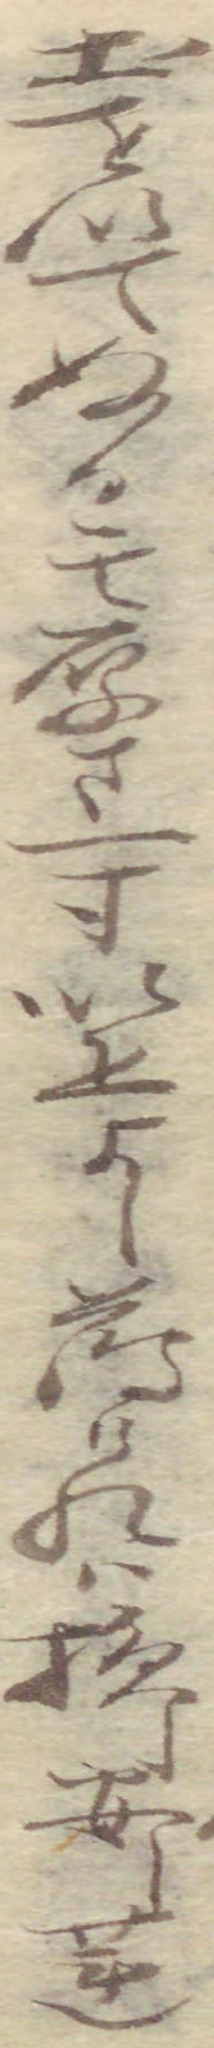土を以てぬる其厚さ一寸以上よし薄けれハ損し安し蓮
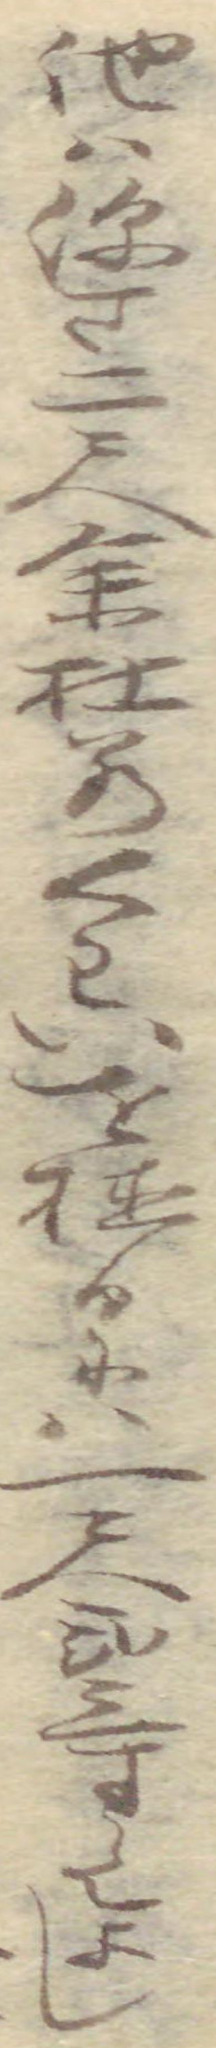池ハ深さ二尺余杜若くわいを植るにハ一尺二三寸二てよし
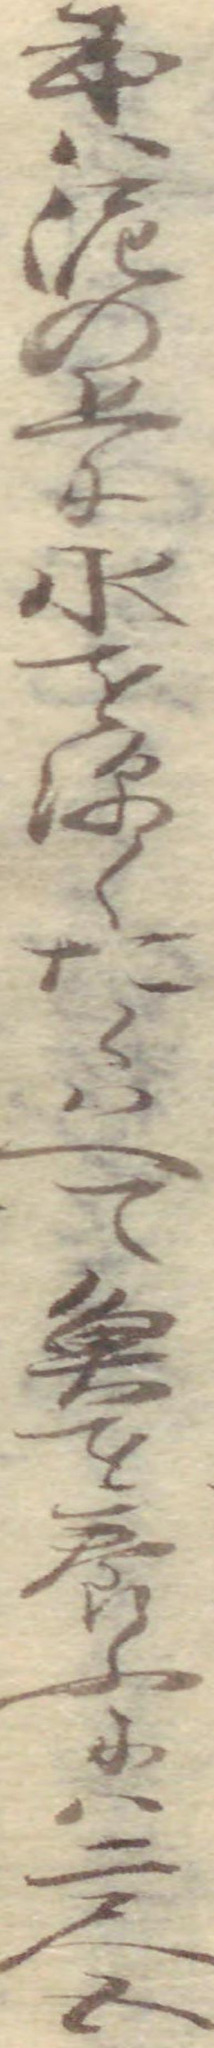或は泥の上に水を深くたくハへて魚を養ふにハ二尺五
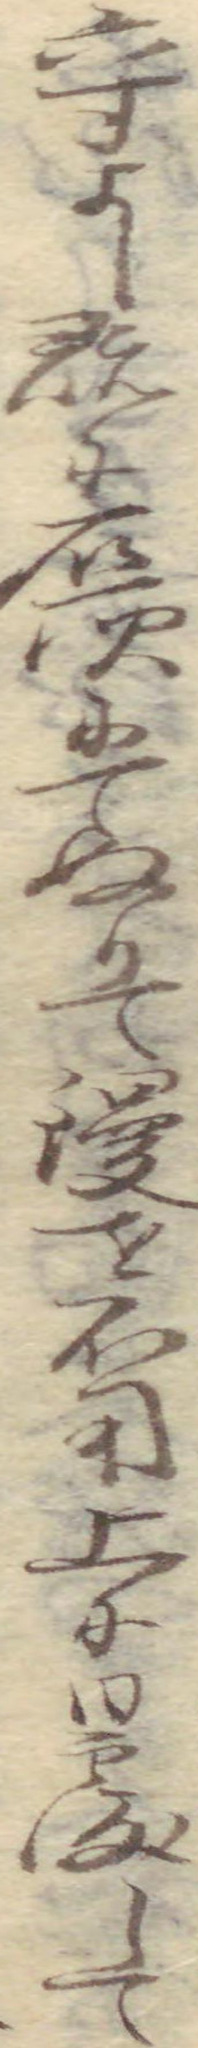六寸よし既に石灰にてぬりて鏝を不用上に日覆して
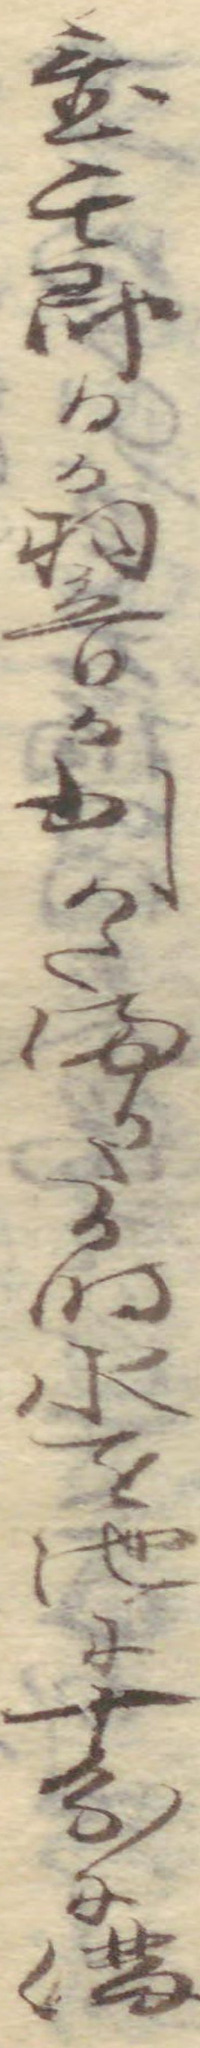置其即日か翌日か少しかたまりたる時水を池に十分に満
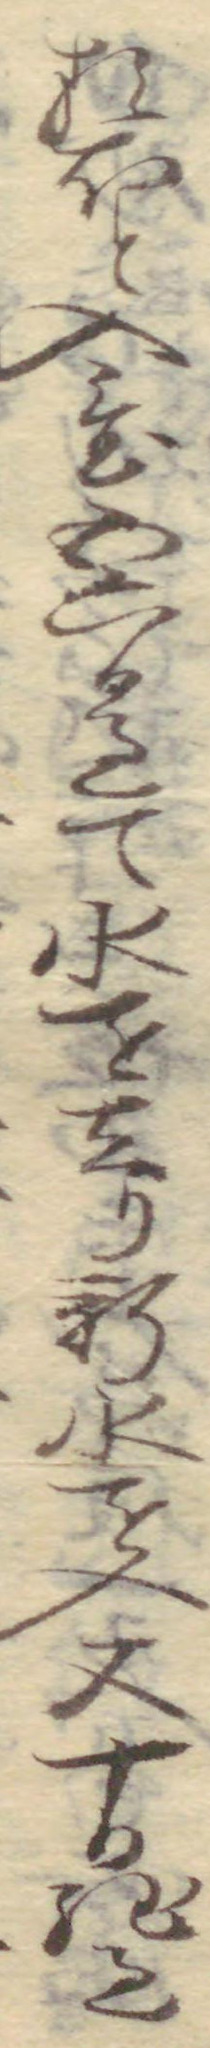るほと入置五六日過て水を去り新水を入又十日程過
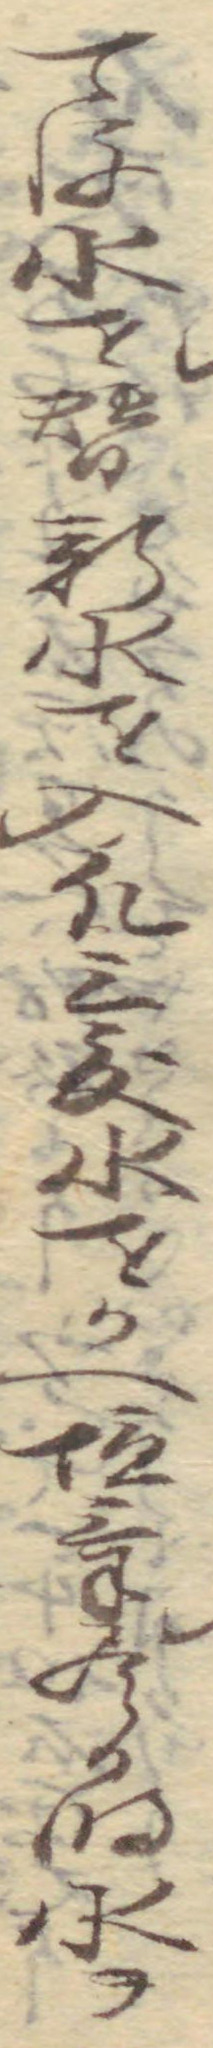て後水を替新水を入凡三度水をかへ塩気尽る時水ヲ
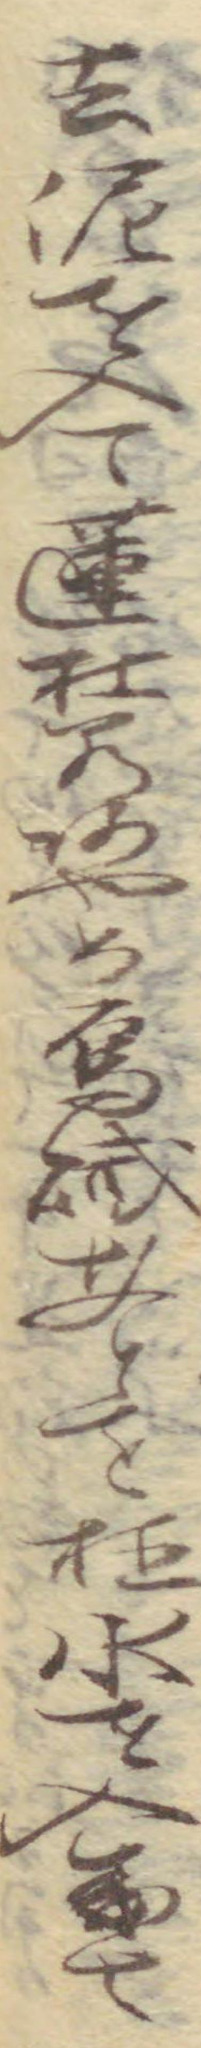去泥を入て蓮杜若あやめ葛賊なとを植水を入或は
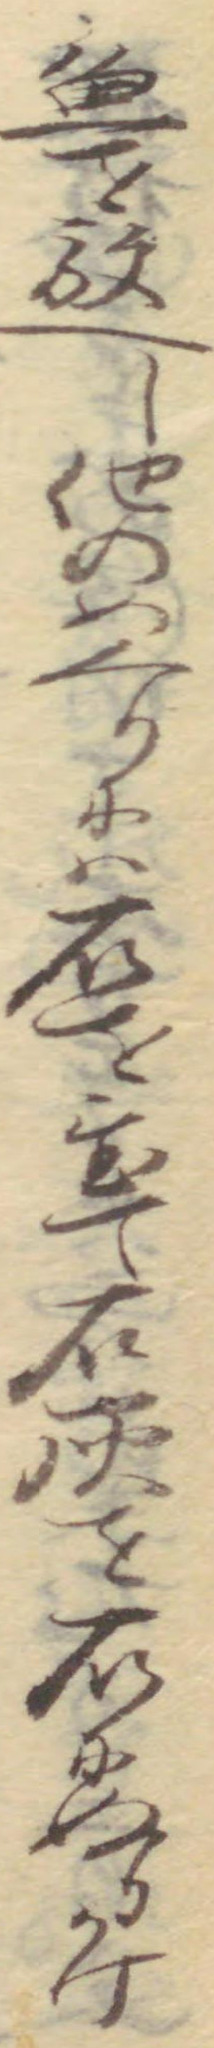魚を放へし池のめくりにハ石を置て石灰を石にぬりかけ
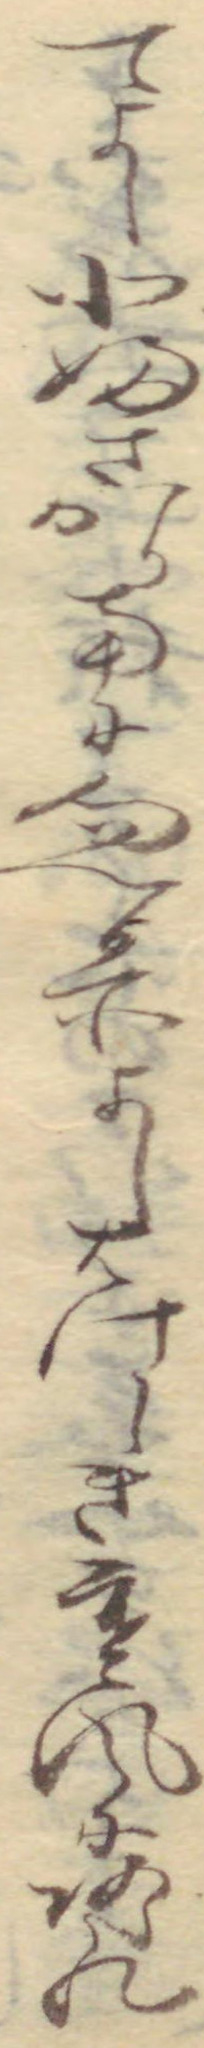てよし北ふさかり南に向へる所よしはけしき寒風にあたれ
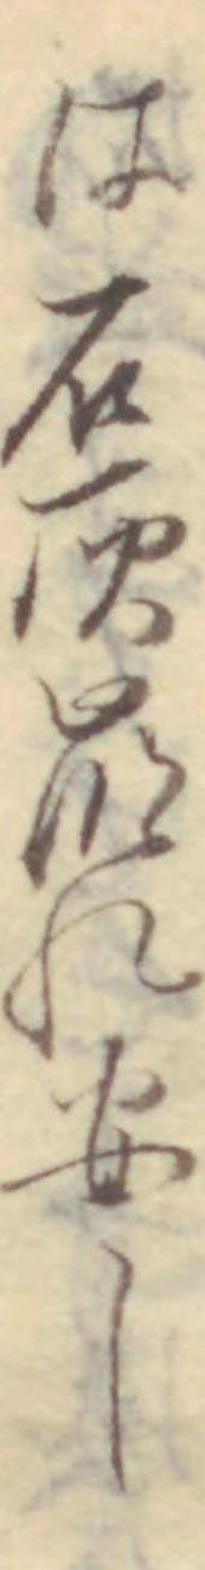は石灰崩れ安し
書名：鶯宿雑記. 巻199-200
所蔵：国立国会図書館 National Diet Library, JAPAN
